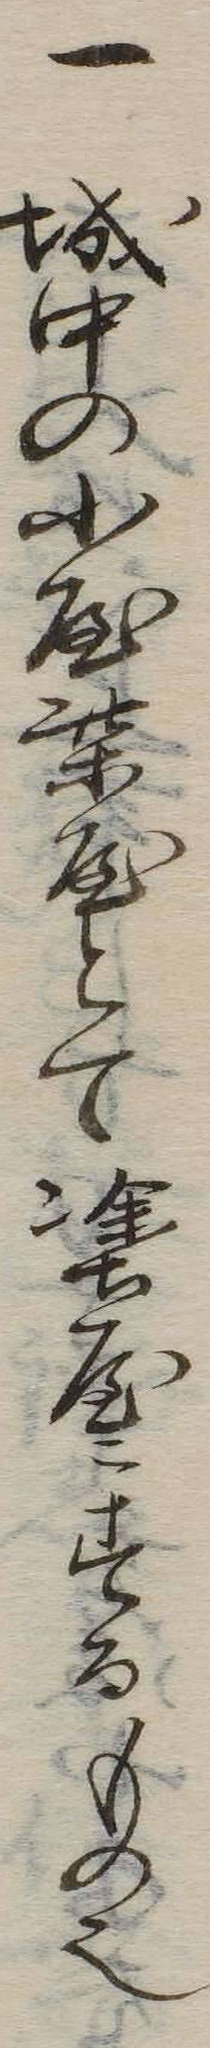一城中の小屋薬屋とて塗屋ニするもの也
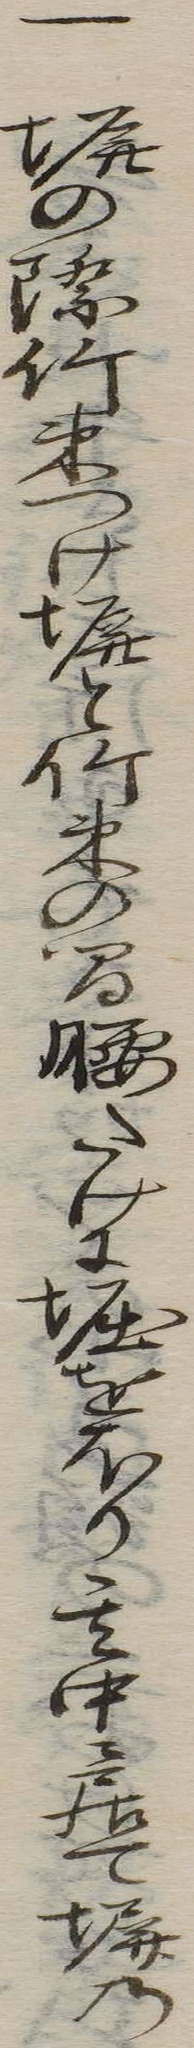一塀の際竹束つけ塀と竹束の間腰たけに堀をほり其中ニ居て塀の
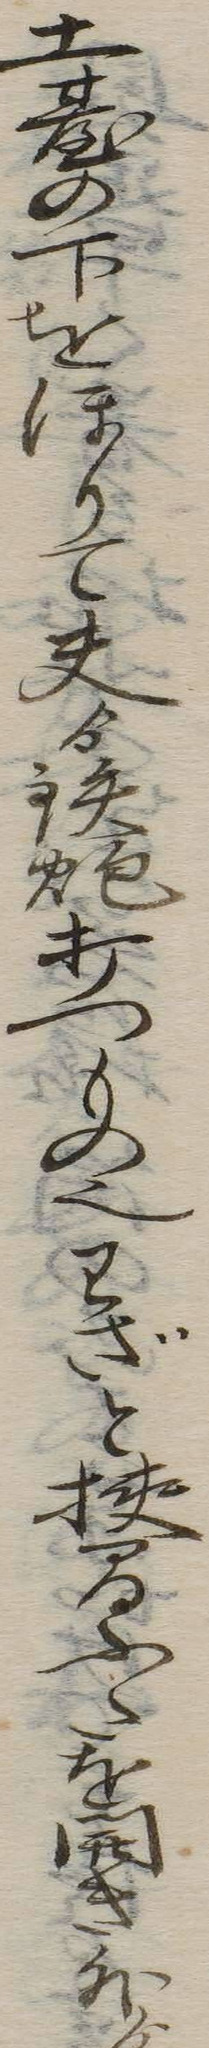土台の下をほりて夫ゟ鉄炮打つもの也わざと狭間ふたを開き外ゟ
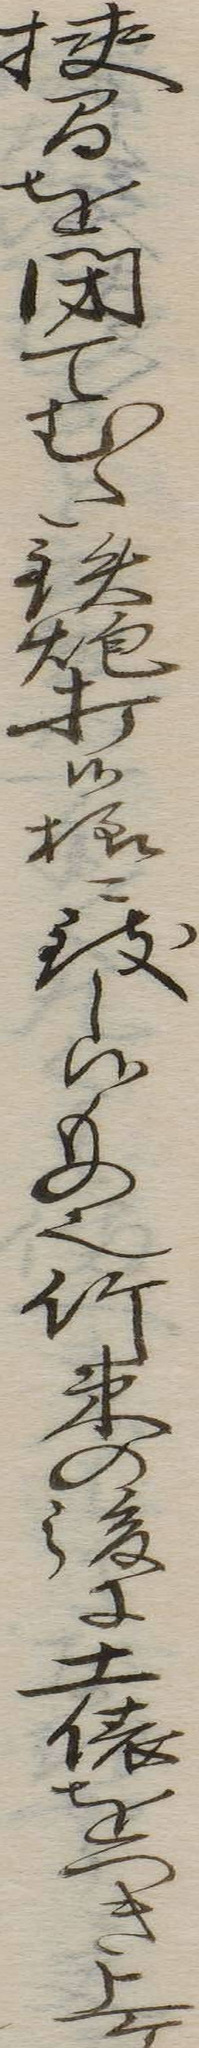狭間を閉てむた鉄炮打候様ニ致し候もの也竹束の後に土俵をつき上ケ
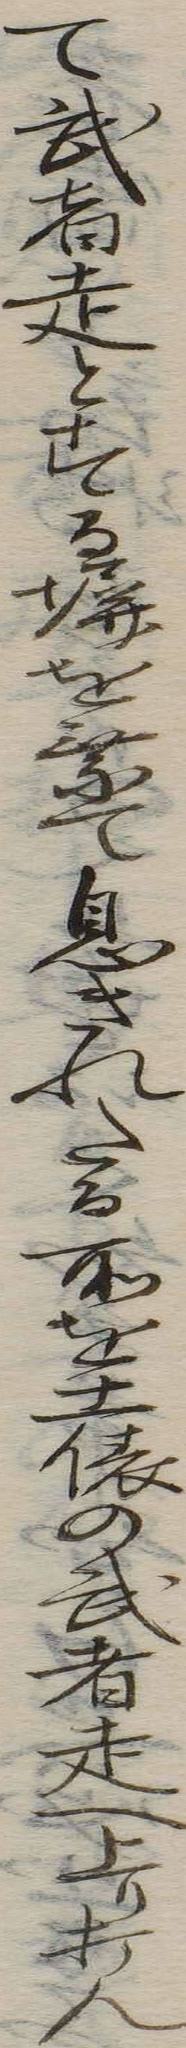て武者走とする塀を乗て息きれたる所を土俵の武者走へ上り打ん
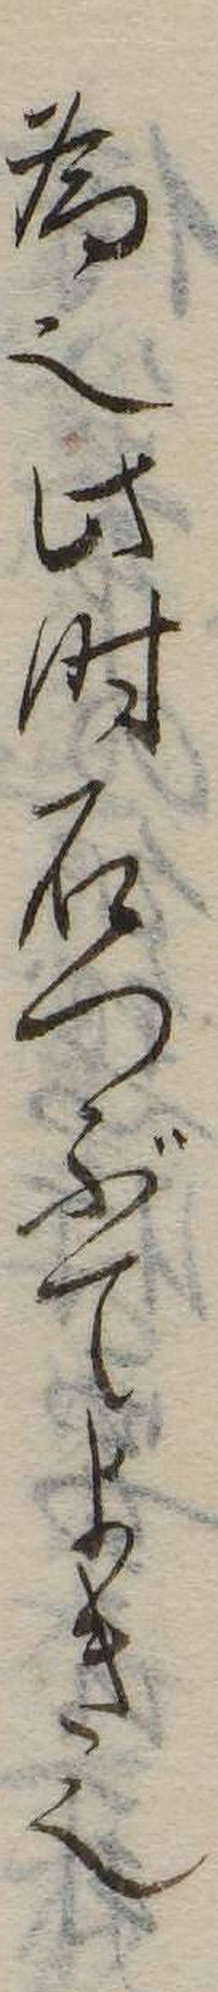為也此時石つぶてよき也
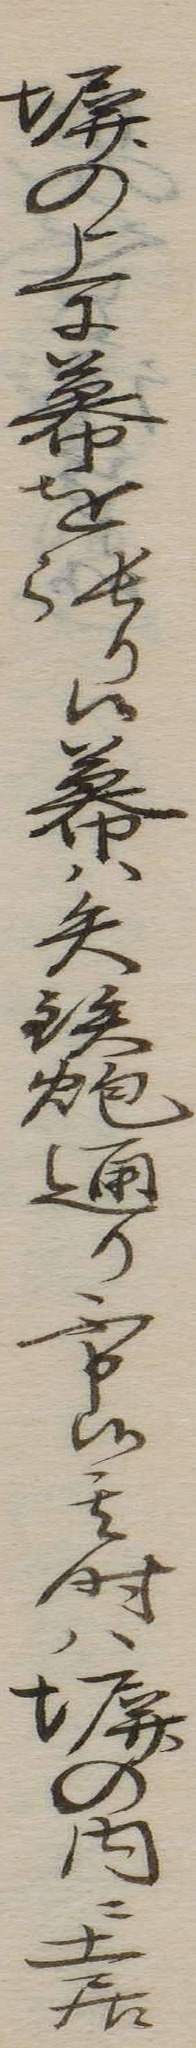一塀の上に幕を張り候幕は矢鉄炮通り不申候其時は塀の内ニ土居
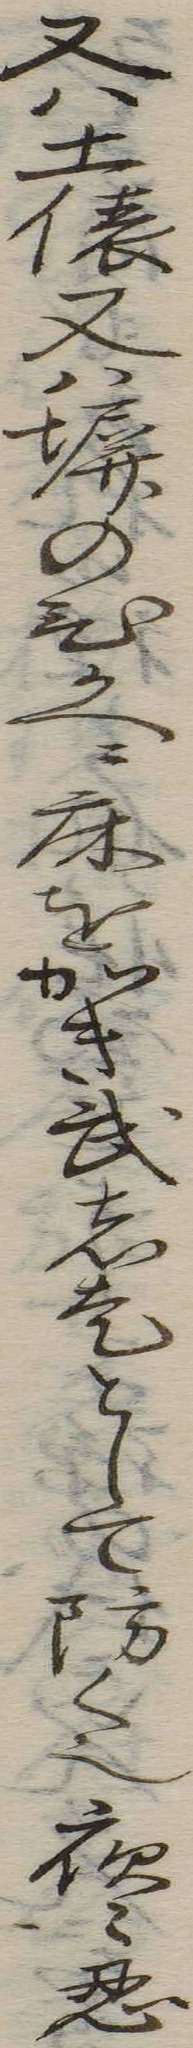又は土俵又は塀のひかへニ床をかき武者走として防く也夜々忍
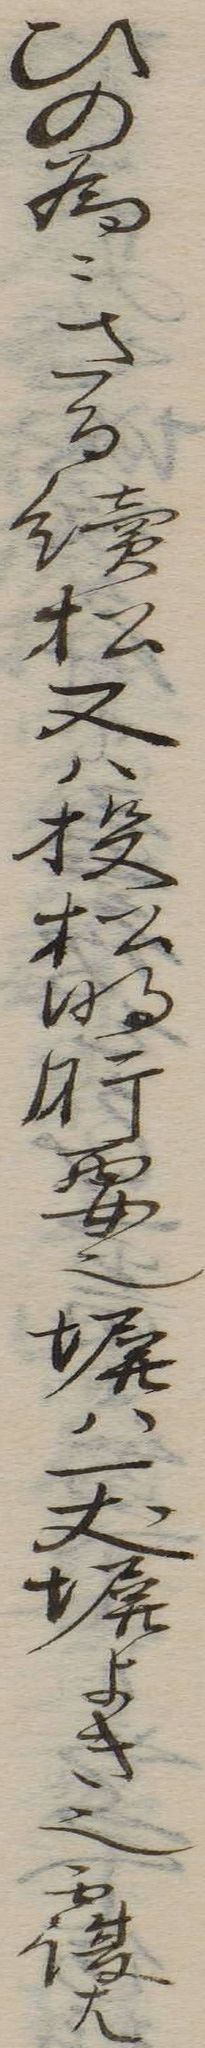ひの為ニさる続松又は投松明肝要也塀は一丈塀よき也覆は
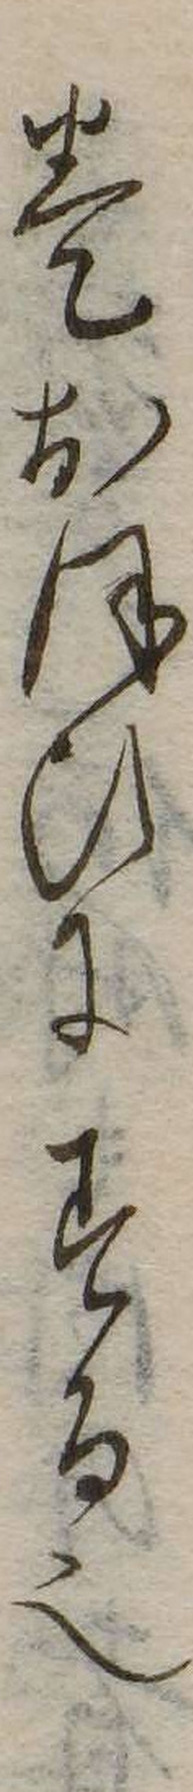巻おほひにする也
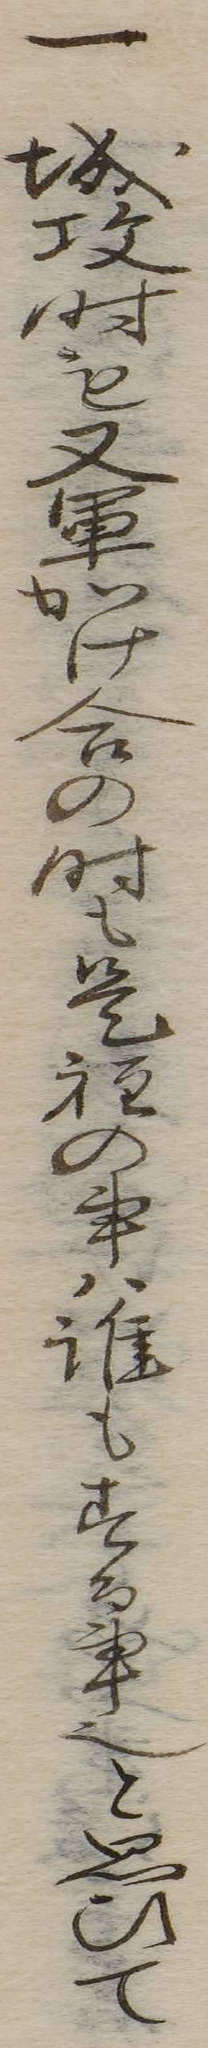一城攻時も又軍かけ合の時も是程の事は誰もする事也と思ひて

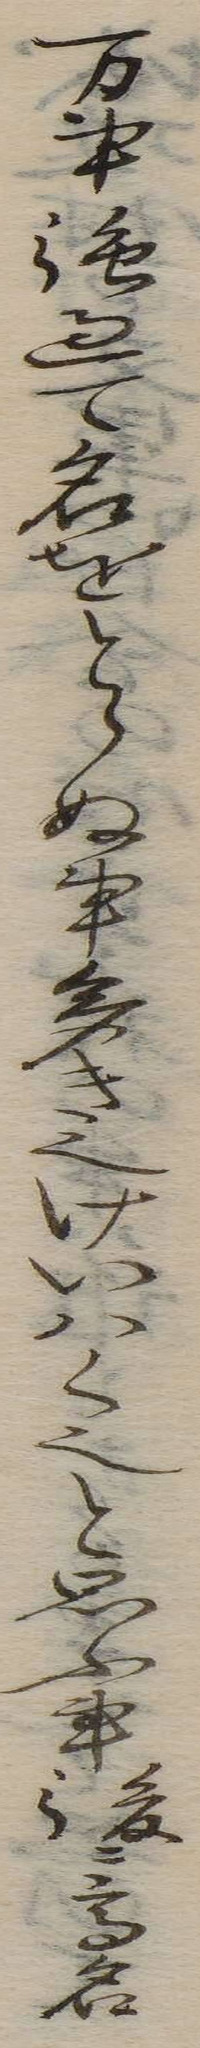万事強過て名をとらぬ事多き也けいはく也と思ふ事後に高名
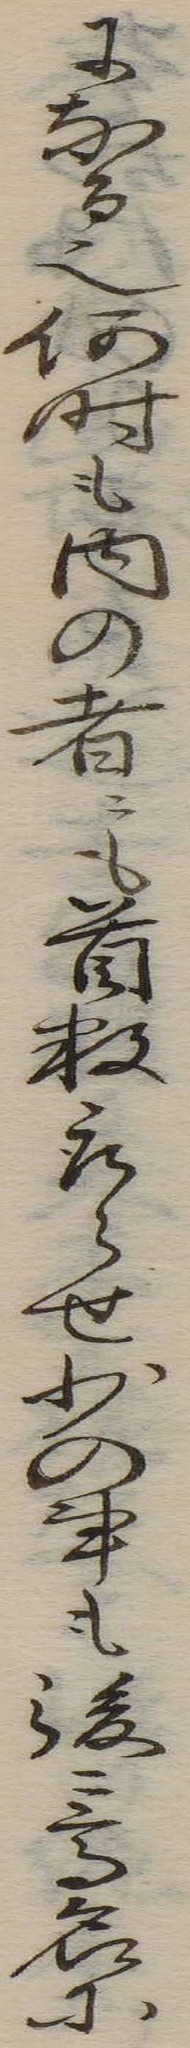になる也何時も内の者ニも首数取らせ少の事も後ニに高名に
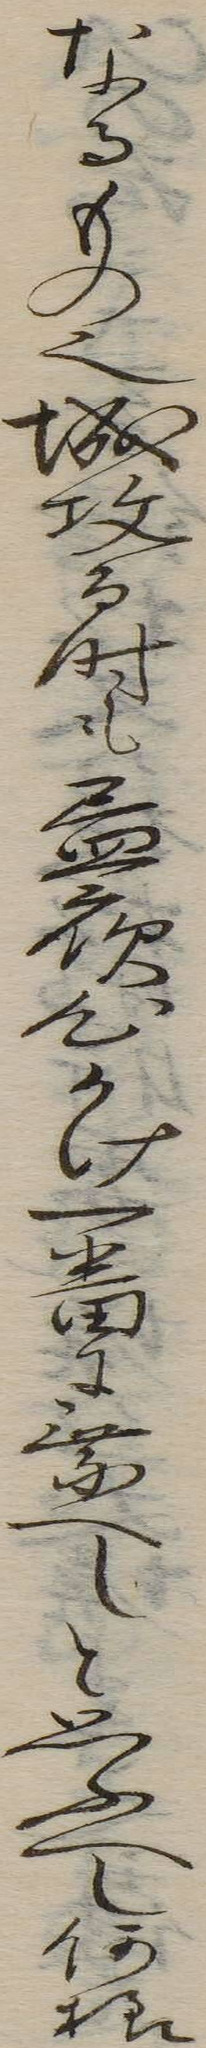なるもの也城攻の時も昼夜心かけ一番に乗へしと思ふへし何様
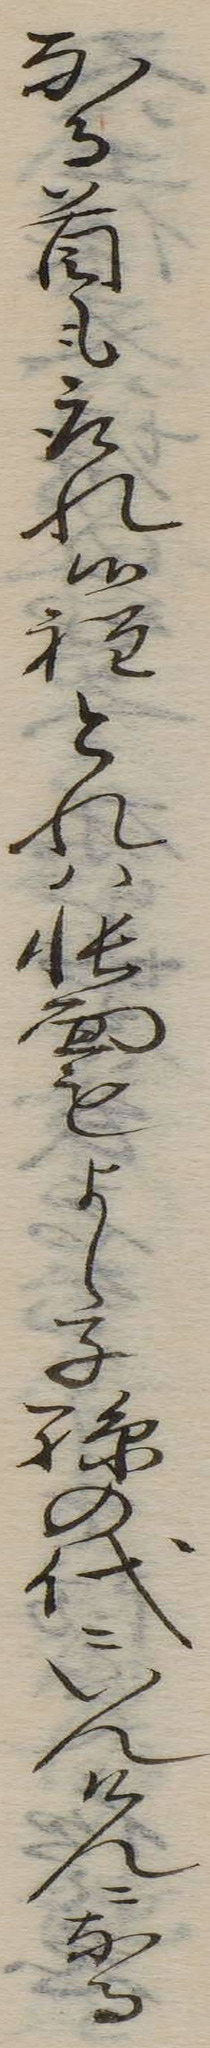なる首も取れ候程とれは帳面もよし子孫の代ニいんけんになる
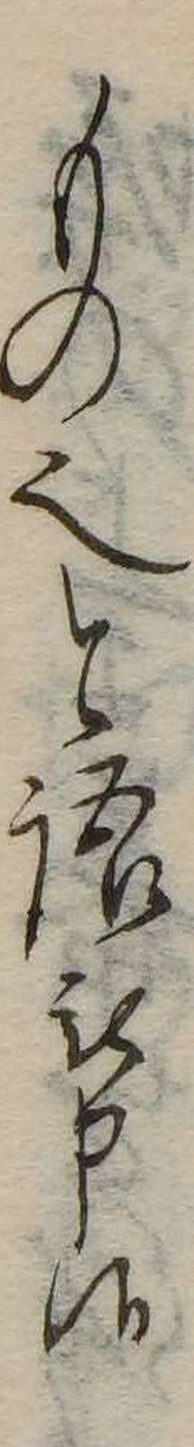もの也と語被申候
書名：三河之物語
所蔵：国文学研究資料館
